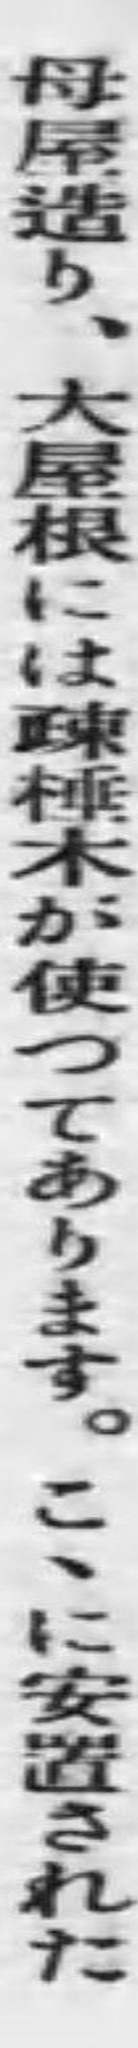母屋造り、大屋根には疎棰木が使つてあります。こヽに安置された
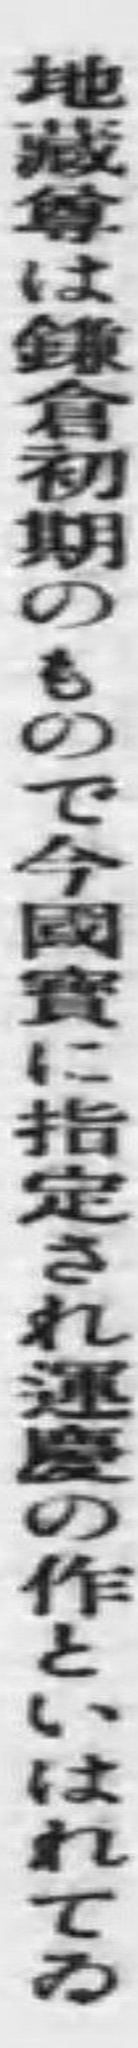地藏尊は鎌倉初期のもので今國寶に指定され運慶の作といはれてゐ
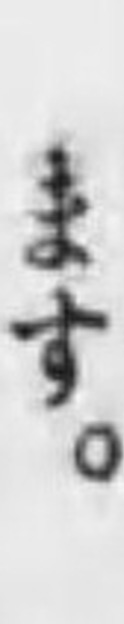ます。
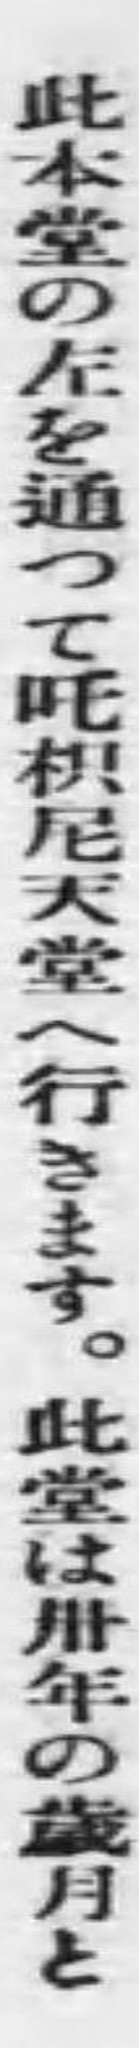此本堂の左を通つて吒枳尼天堂へ行きます。此堂は卅年の歳月と

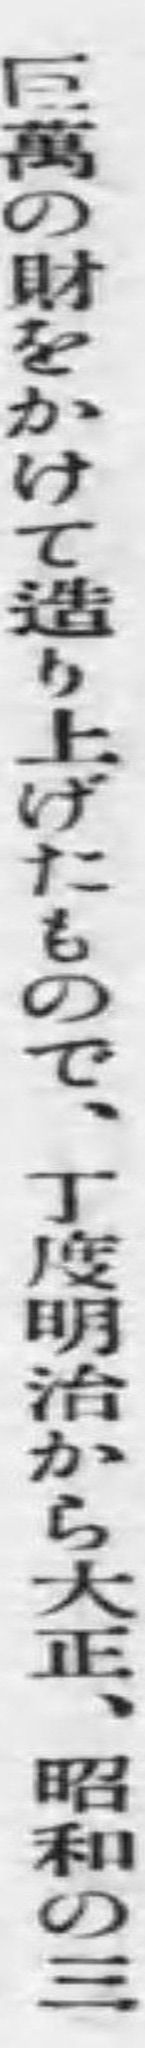巨萬の財をかけて造り上げたもので、丁度明治から大正、昭和の三
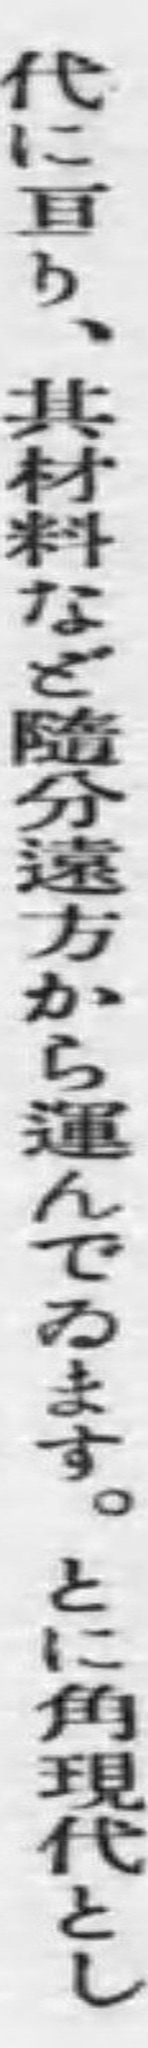代に亘り、其材料など隨分遠方から運んでゐます。とに角現代とし
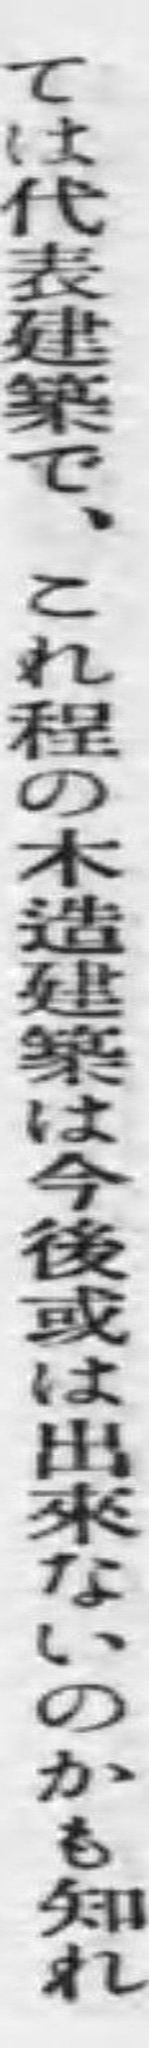ては代表建築で、これ程の木造建築は今後或は出來ないのかも知れ
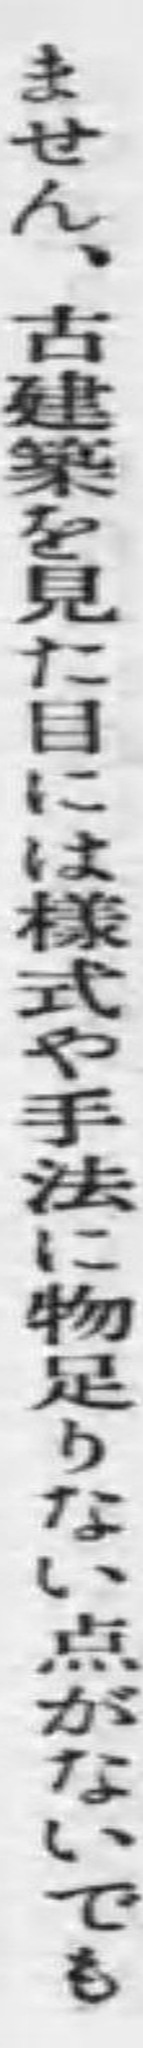ません、古建築を見た目には樣式や手法に物足りない点がないでも
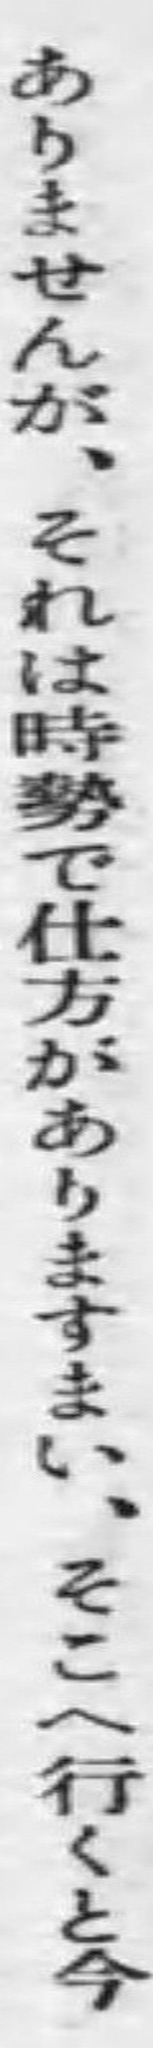ありませんが、それは時勢で仕方がありますまい、そこへ行くと今
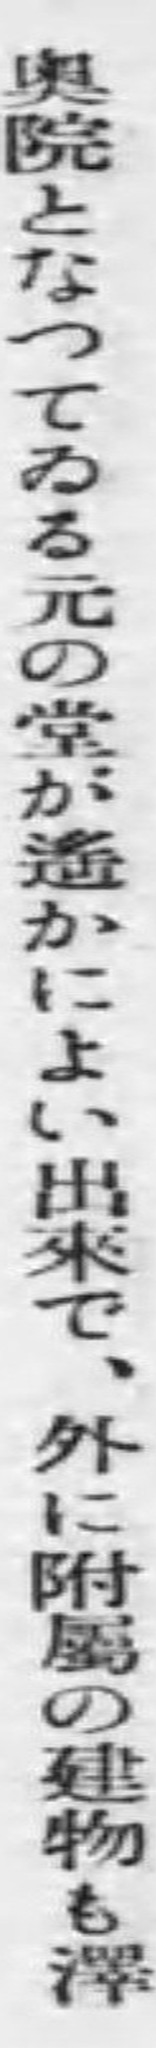奥院となつてゐる元の堂が遙かによい出來で、外に附屬の建物も澤
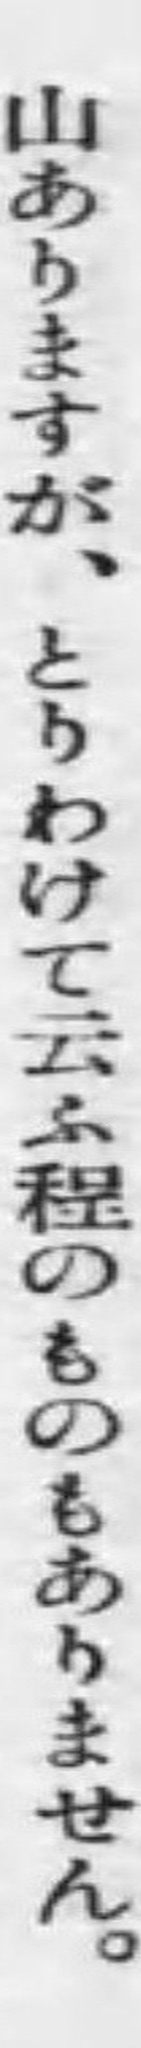山ありますが、とりわけて云ふ程のものもありません。
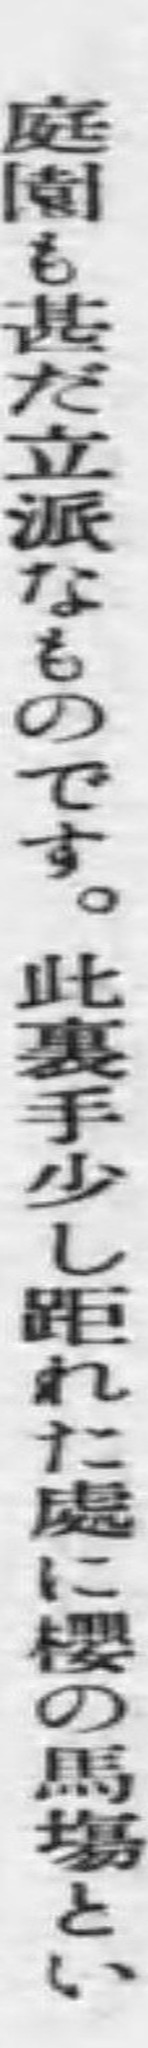庭園も甚だ立派なものです。此裏手少し距れた處に櫻の馬塲とい
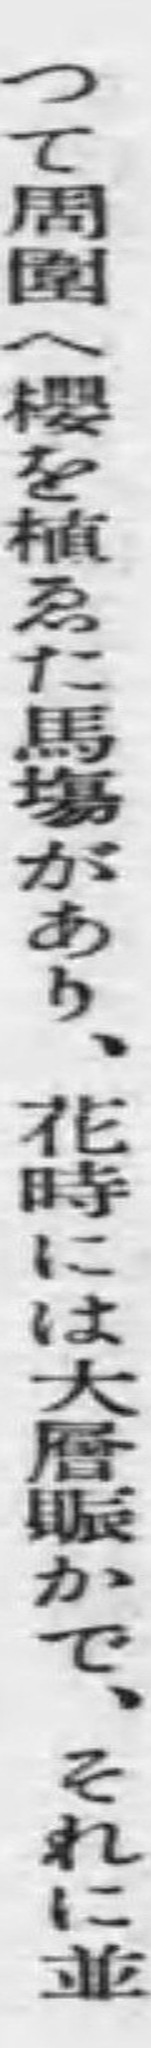つて周圍へ櫻を植ゑた馬塲があり、花時には大層賑かで、それに並
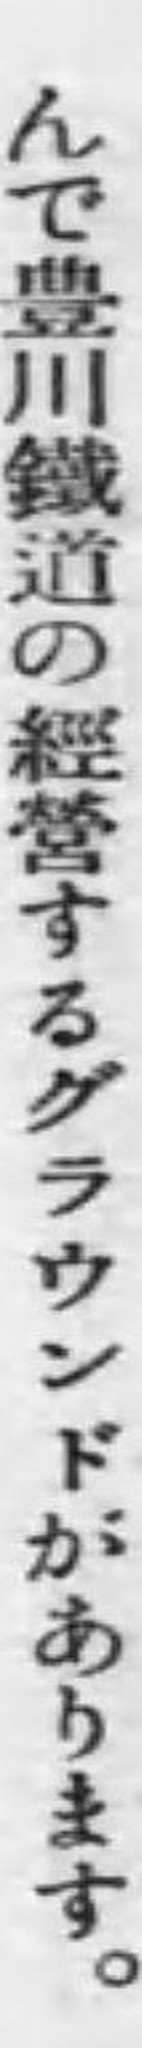んで豊川鐵道の經營するグラウンドがあります。
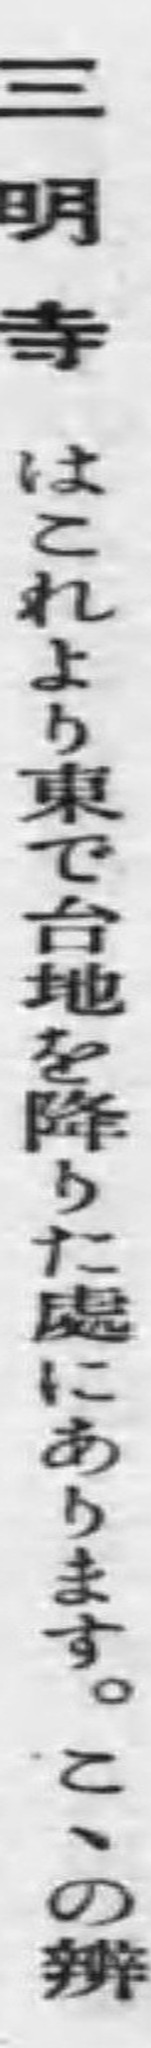三明寺はこれより東で台地を降りた處にあります。こヽの辨
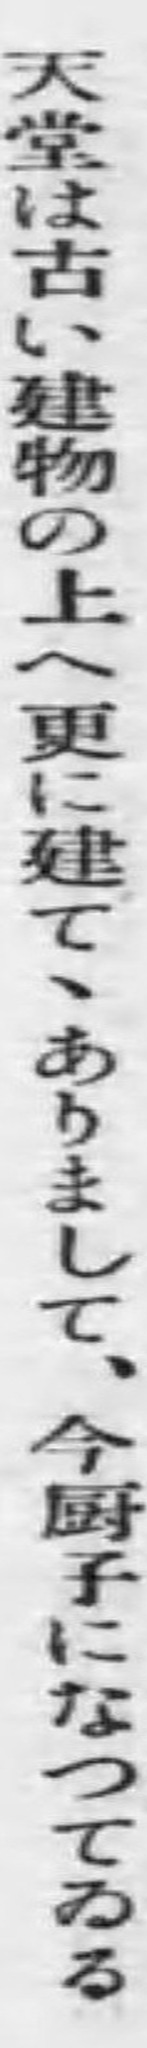天堂は古い建物の上へ更に建てヽありまして、今厨子になつてゐる
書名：東三河道中記 : 豊橋市及其附近案内
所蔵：国立国会図書館 National Diet Library, JAPAN
